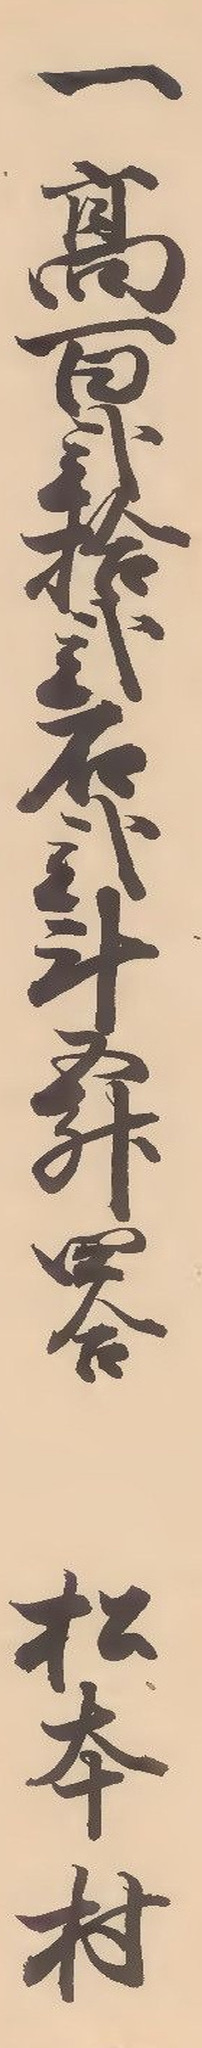一高百弐拾弐石弐斗五升四合松本村
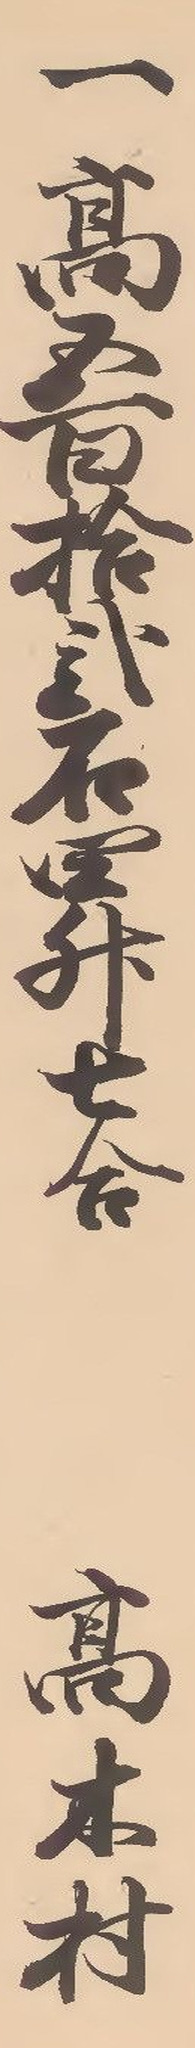一高五百拾弐石四升七合高木村
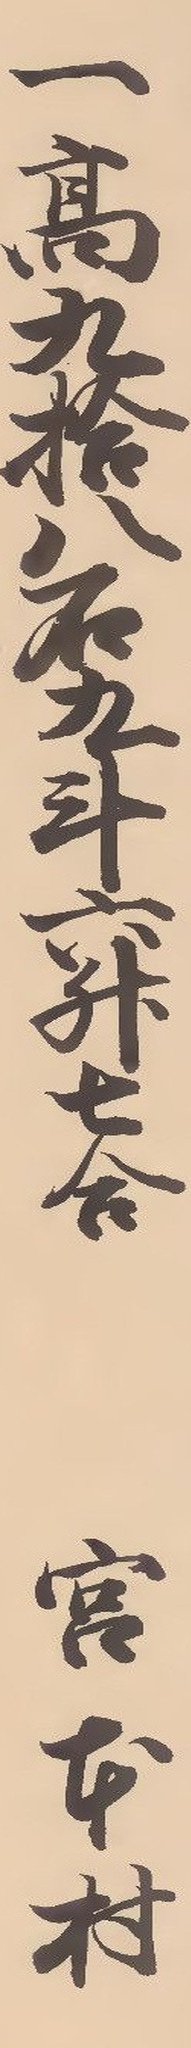一高九拾八石九斗六升七合宮本村
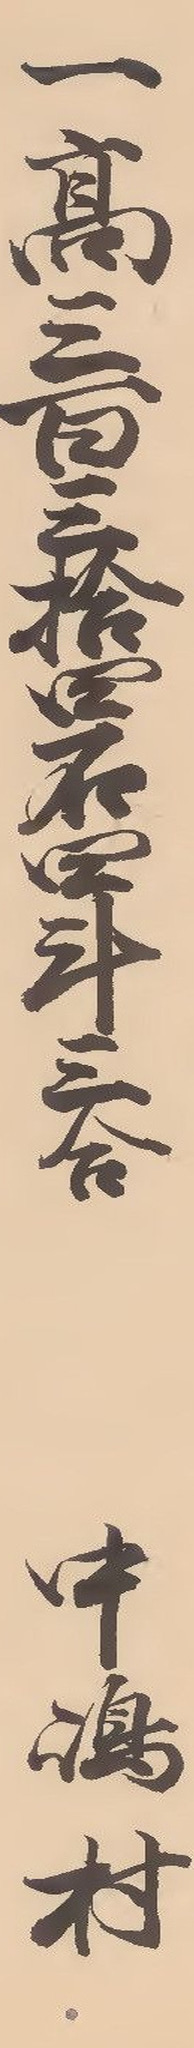一高三百三拾四石四斗三合中島村
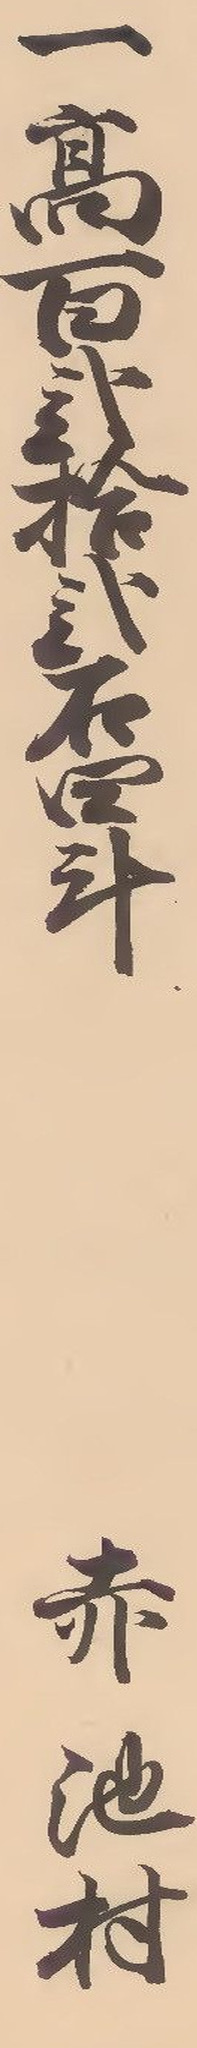一高百弐拾弐石四斗赤池村

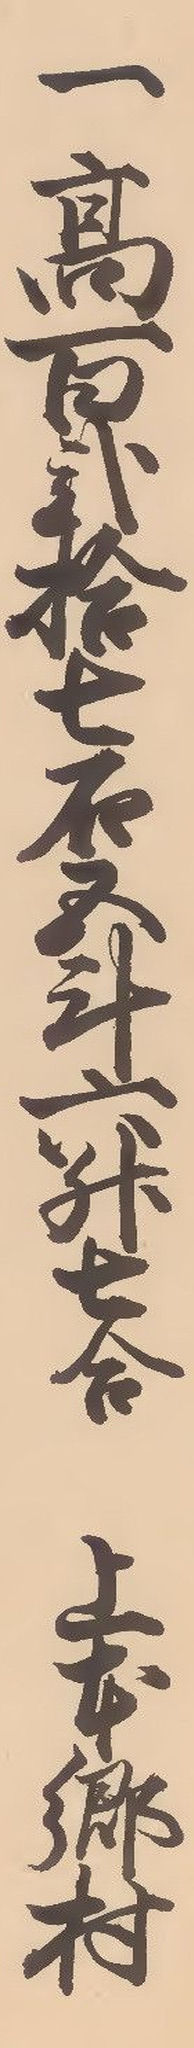一高百弐拾七石五斗六升七合上本郷村
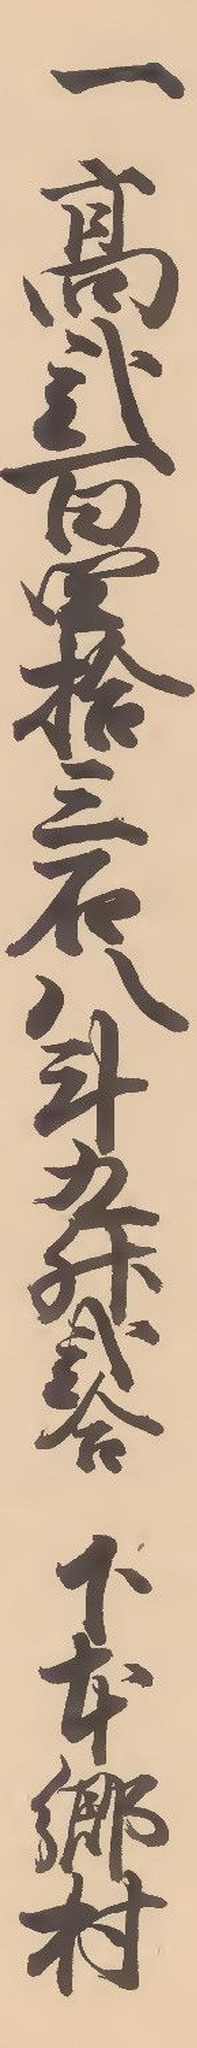一高弐百四拾三石八斗九升弐合下本郷村
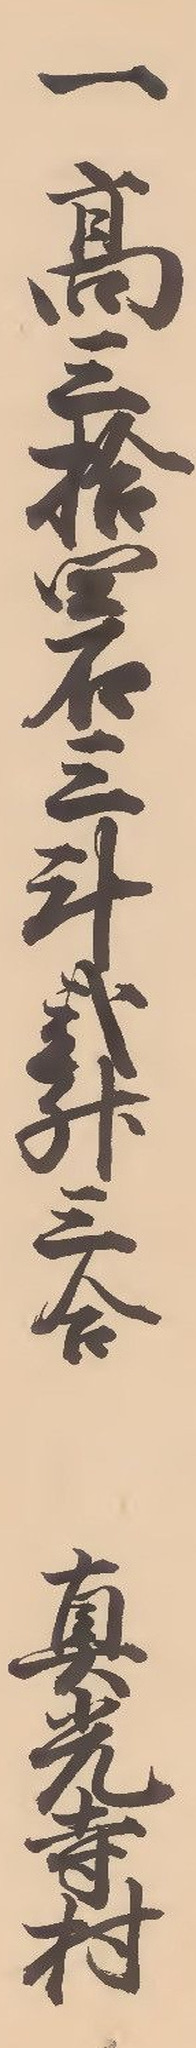一高三拾四石三斗弐升三合真光寺村
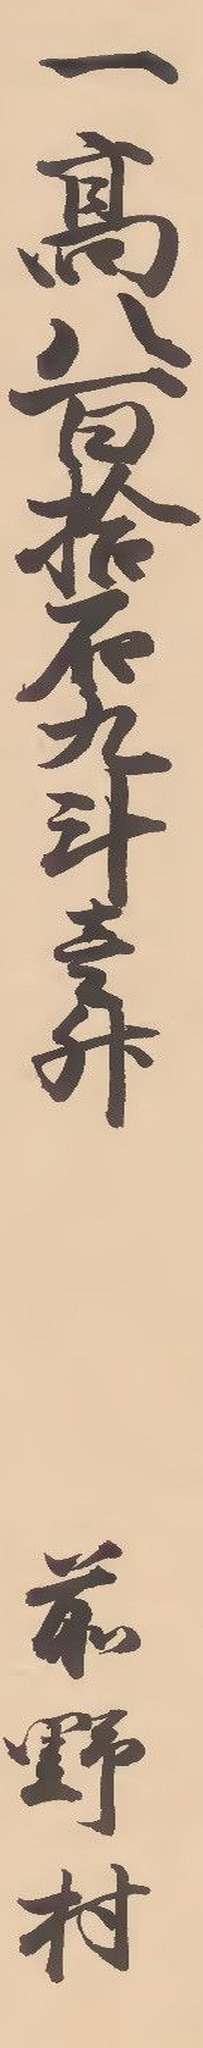一高八百拾石九斗壱升前野村
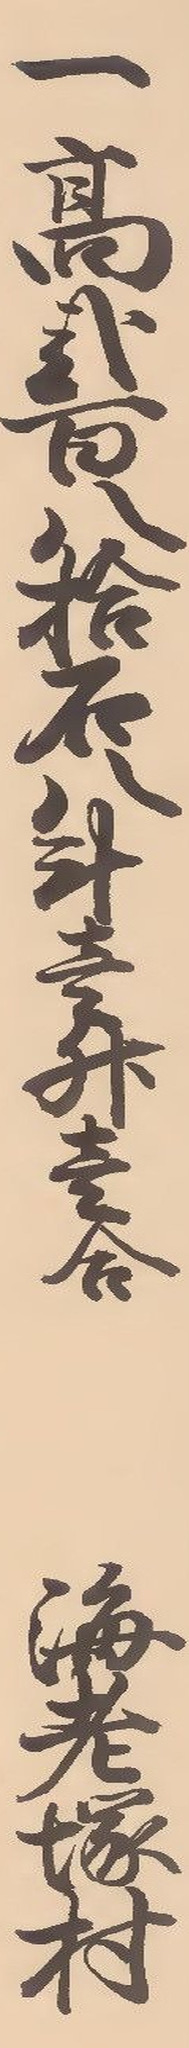一高弐百八拾石八斗壱升壱合海老塚村
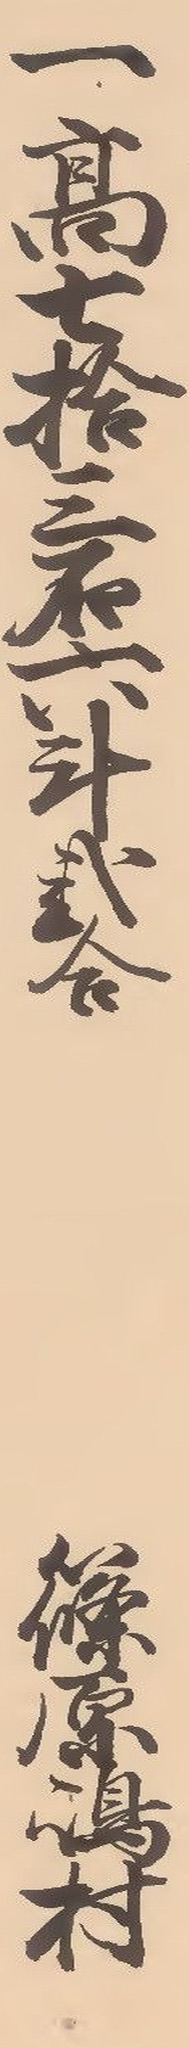一高七拾三石六斗弐合篠原島村
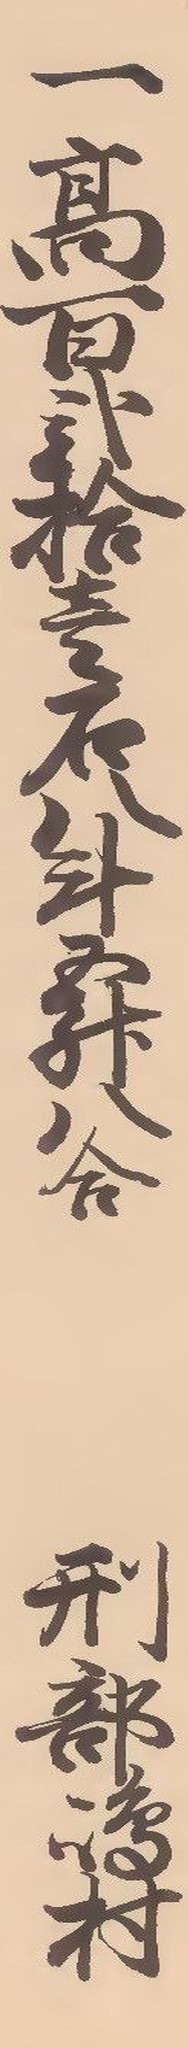一高百弐拾壱石八斗五升八合刑部島村
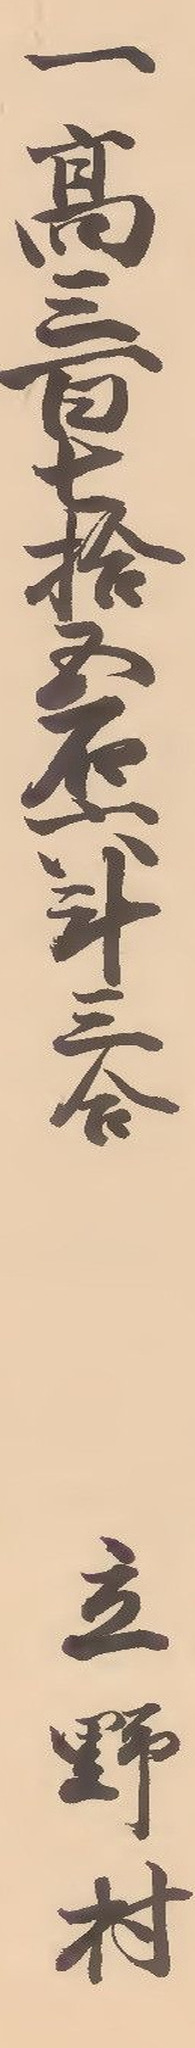一高三百七拾五石六斗三合立野村

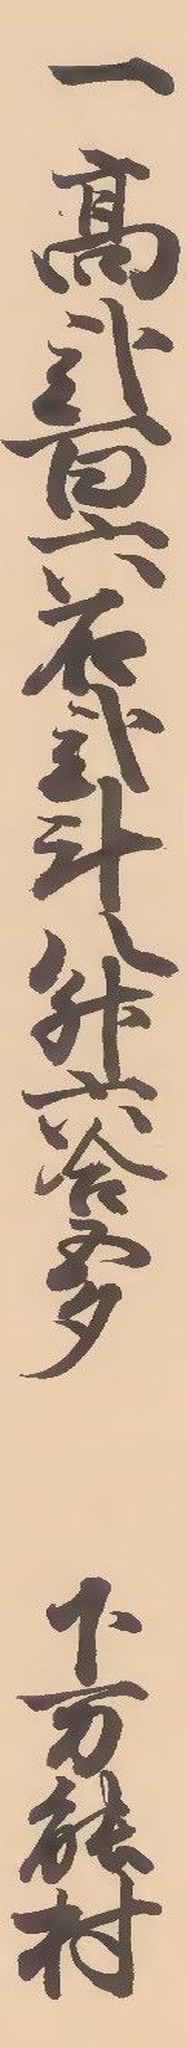一高弐百六石弐斗八升六合五勺下万能村
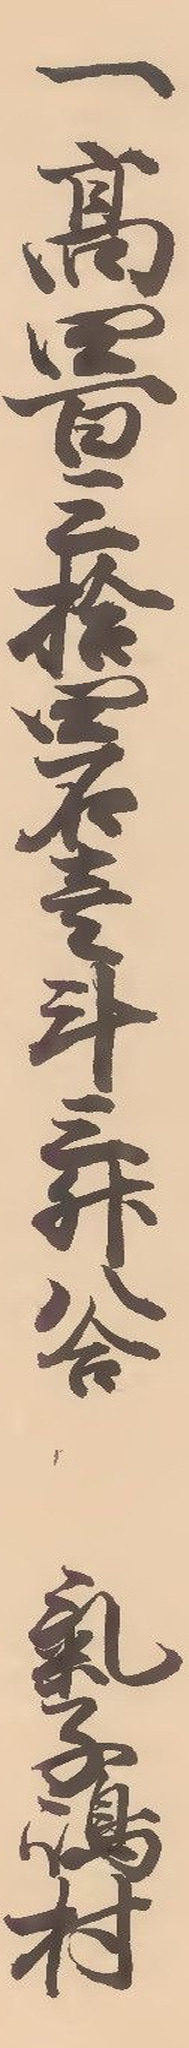一高四百三拾四石壱斗三升八合気子島村
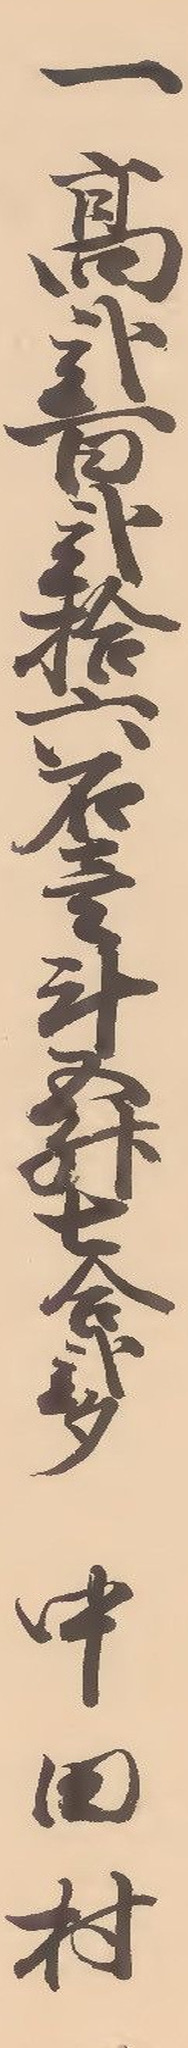一高弐百弐拾六石壱斗五升七合弐勺中田村
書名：遠江国郷帳
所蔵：国立公文書館 National Archives of Japan
